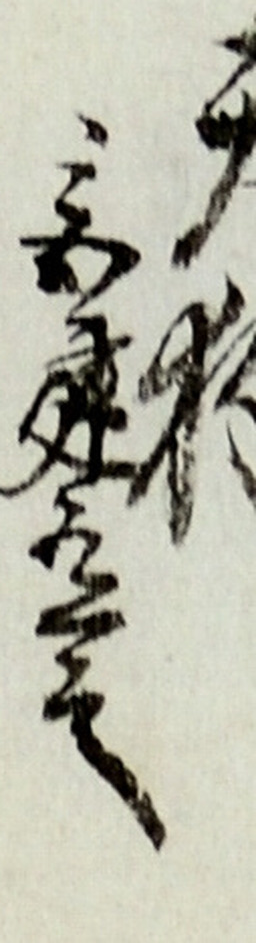宮建有之
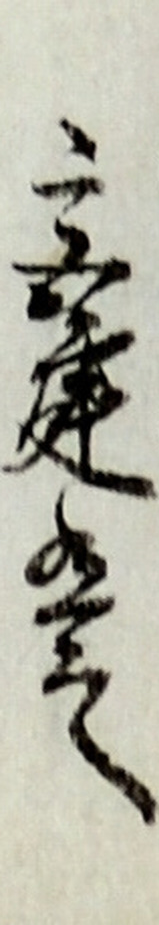宮建有之
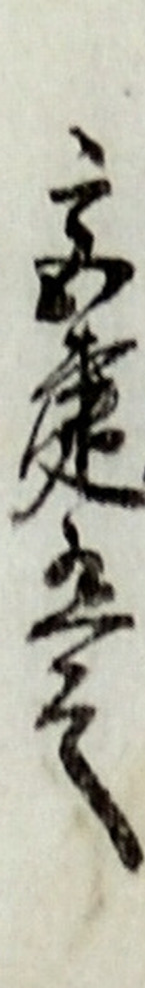宮建有之
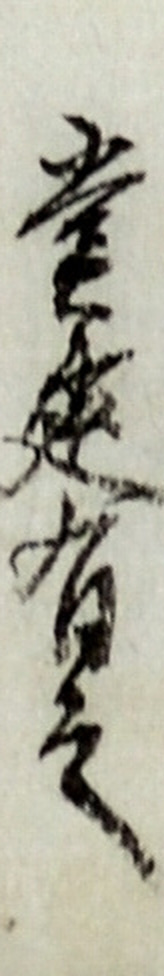堂建有之

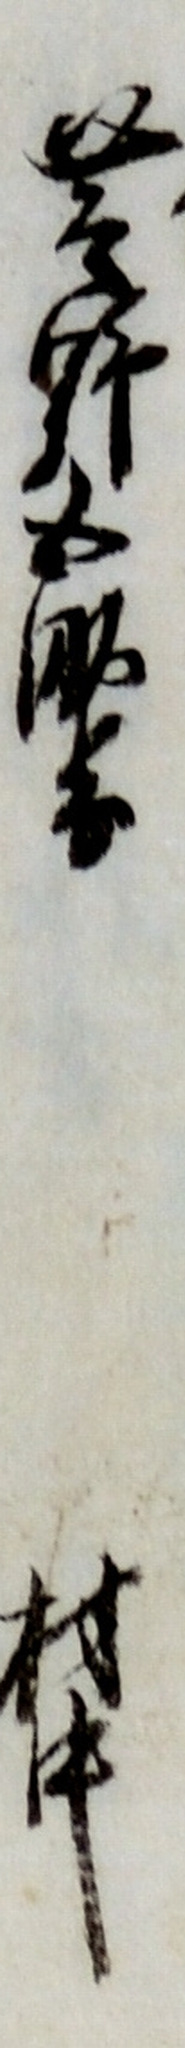芝野五畝歩村中
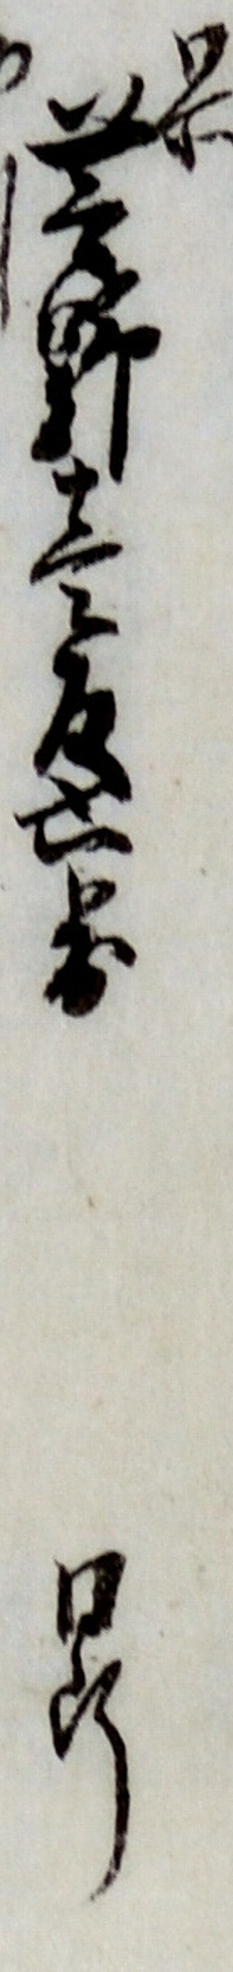芝野壱反六歩同断
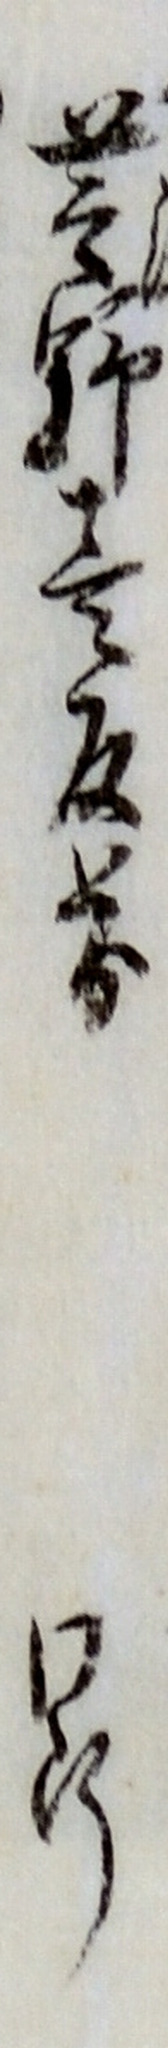芝野壱反歩同断
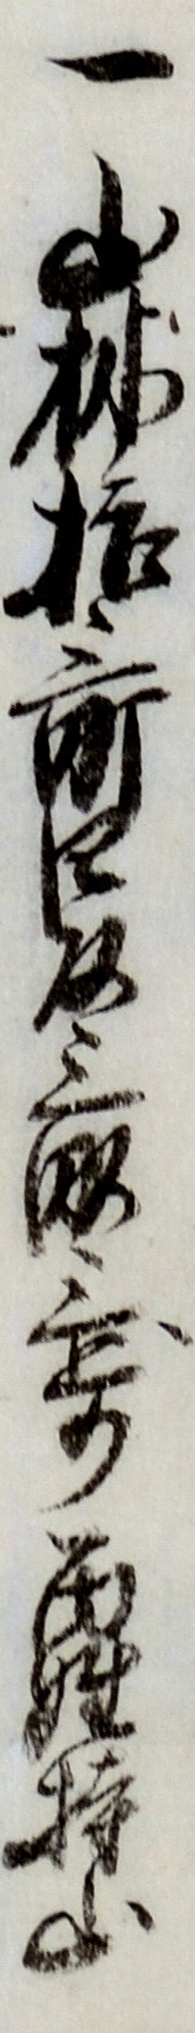一山林拾三町四反三畝三歩百姓持山
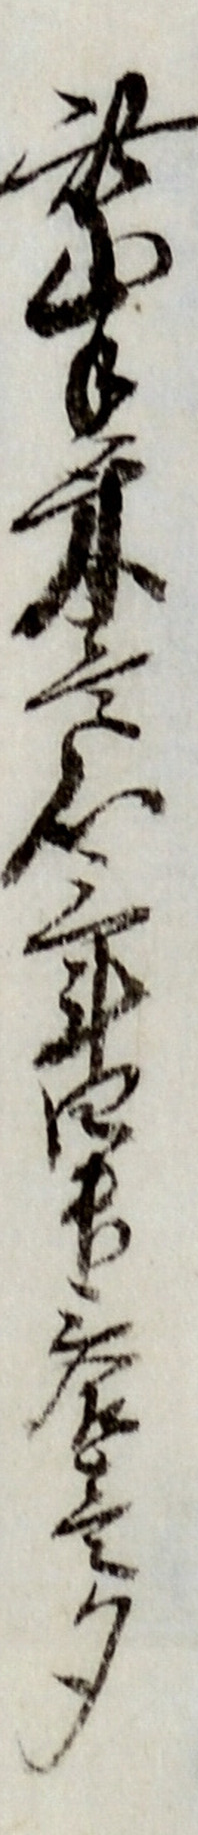此山手米一石三斗四升三合壱勺
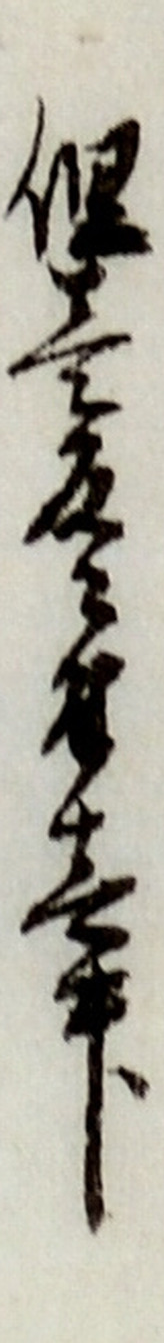但壱反ニ付壱升
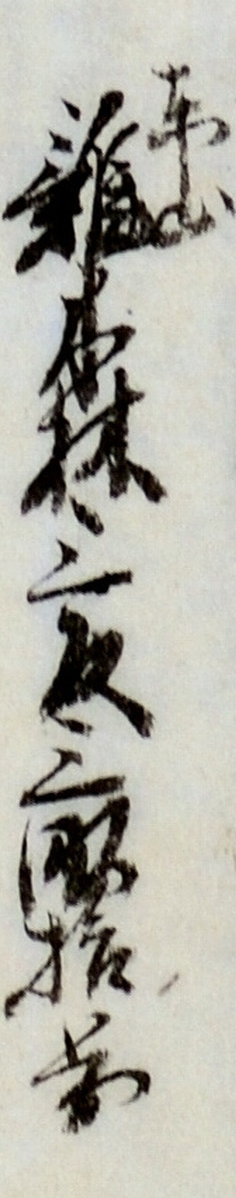雑木林八反弐畝拾五歩
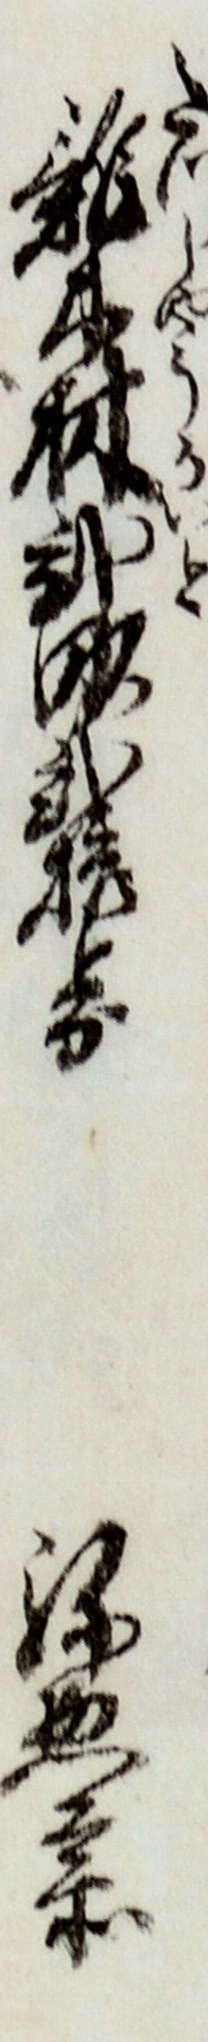雑木林弐畝弐拾歩弥惣兵衛
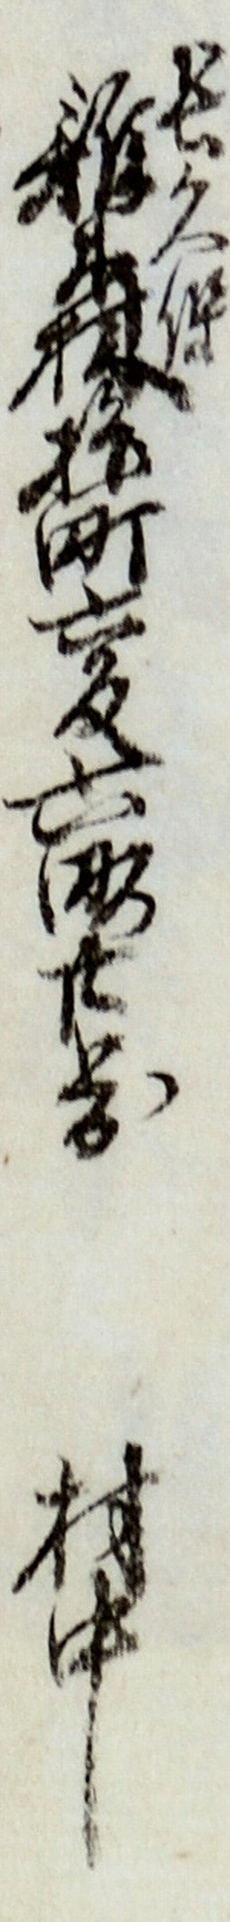雑木林拾町六反六畝廿歩村中
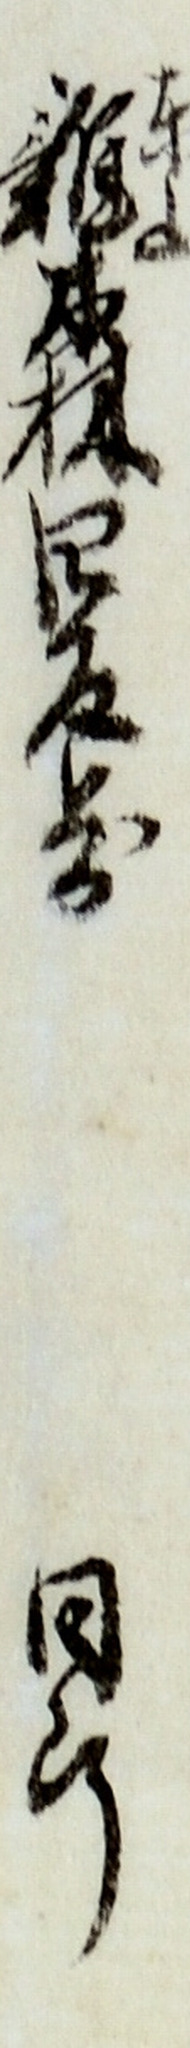雑木林四反歩同断
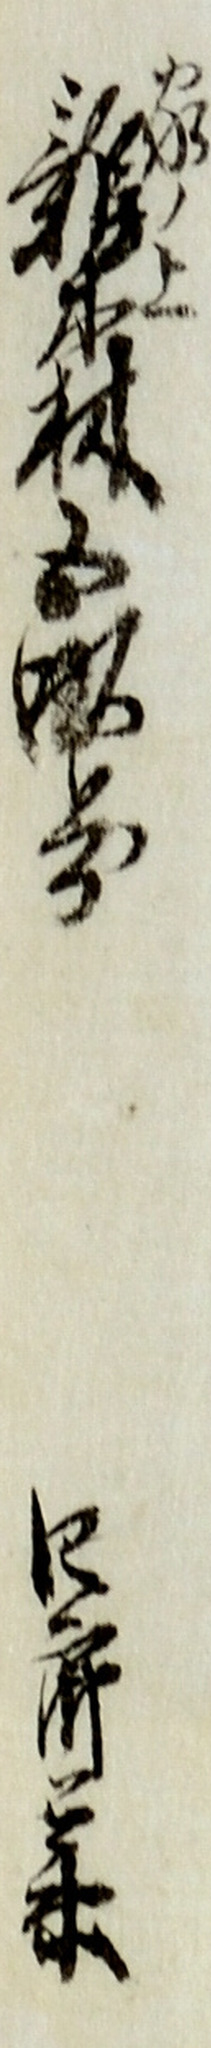雑木林五畝歩四郎兵衛
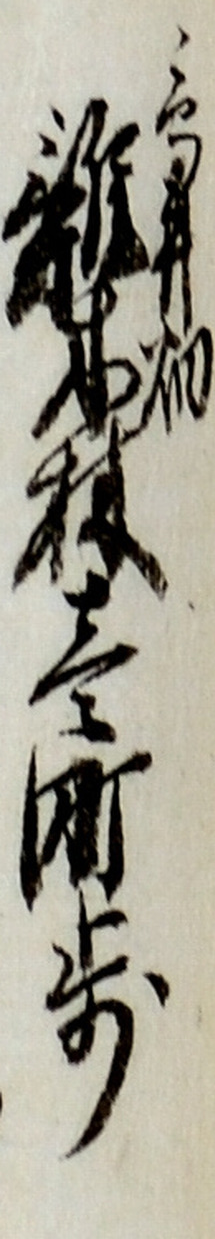雑木林壱町歩
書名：御領分中山林社地手控
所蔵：伊那市立高遠町図書館・合同会社AMANE
